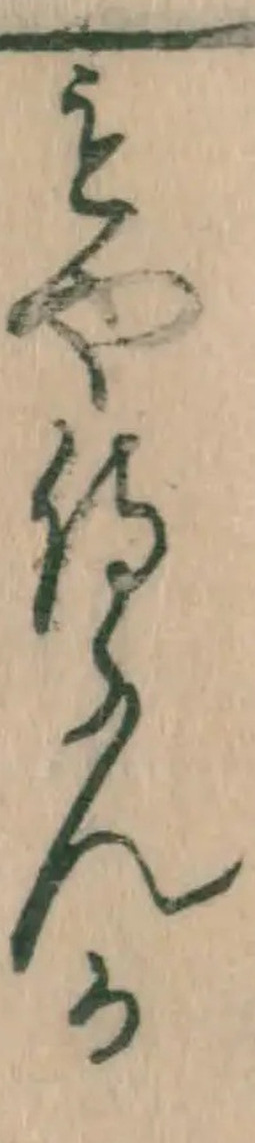もや侍らんか
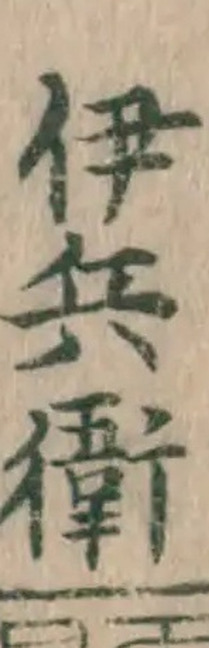伊兵衛
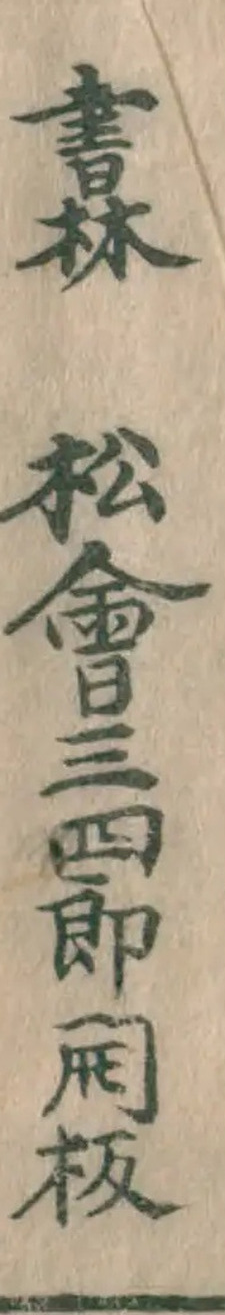書林松會三四郎開板
